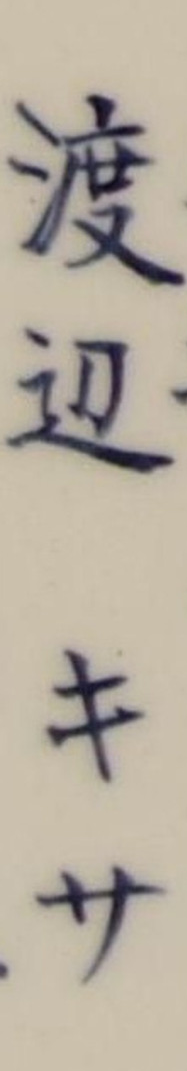渡辺キサ
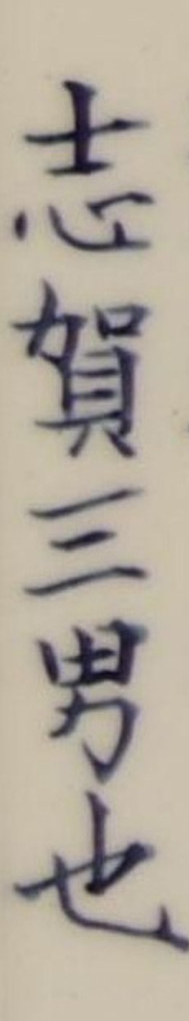志賀三男也

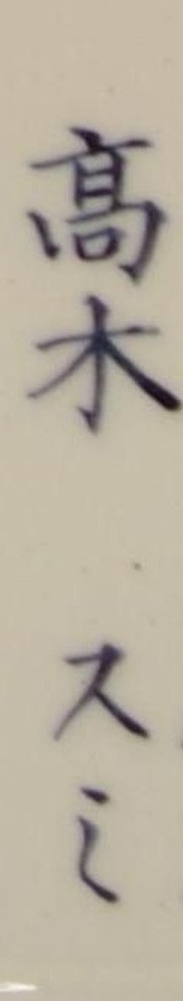高木スミ
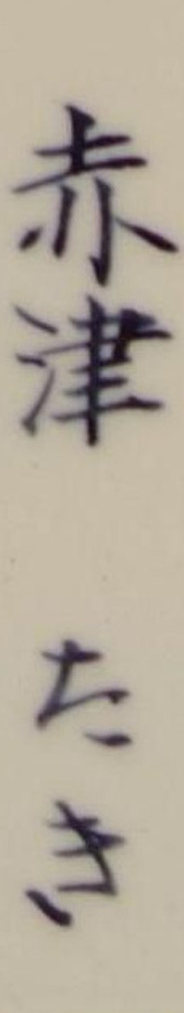赤津たき
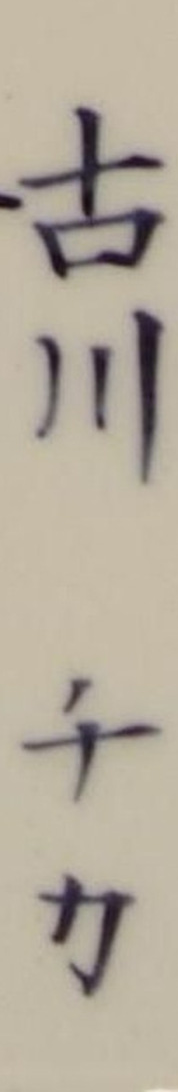古川チカ
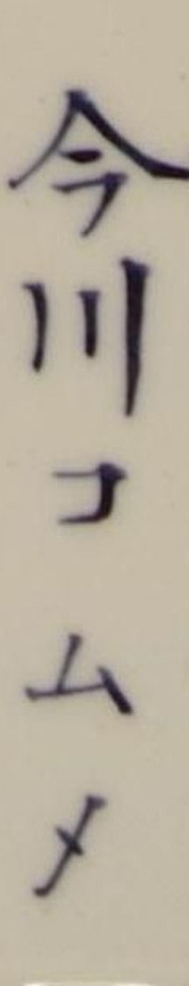今川コムメ
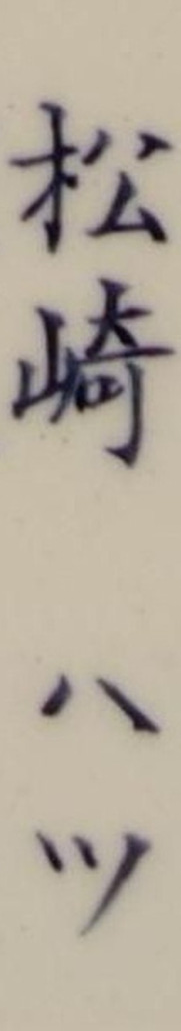松崎ハツ
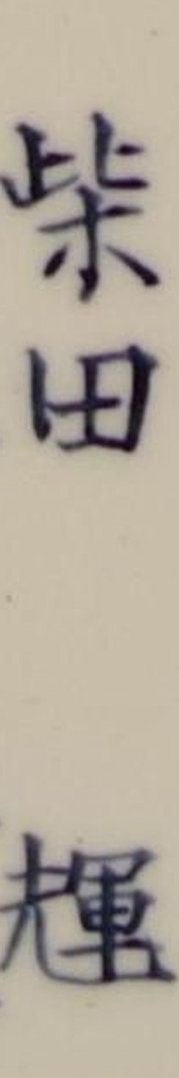柴田輝
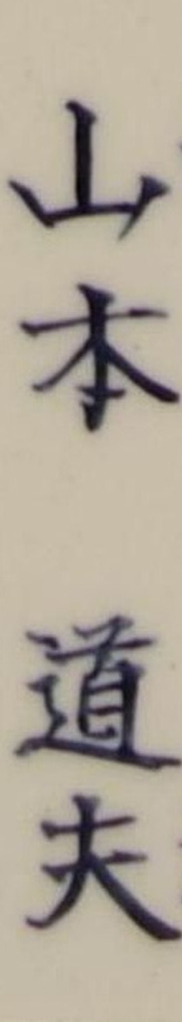山本道夫
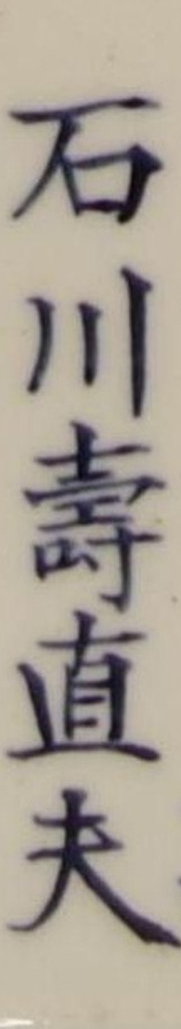石川寿直夫
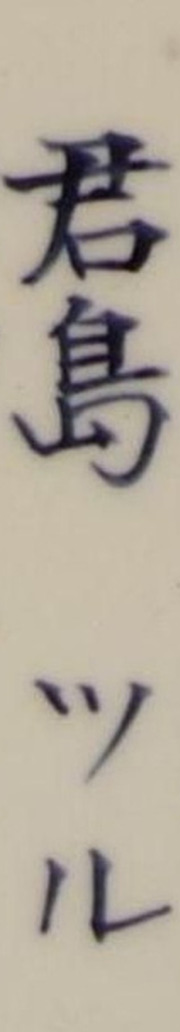君島ツル
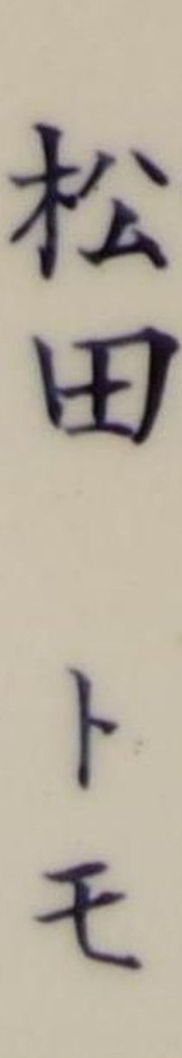松田トモ
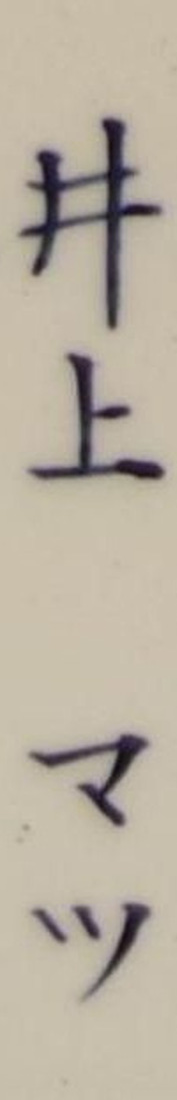井上マツ
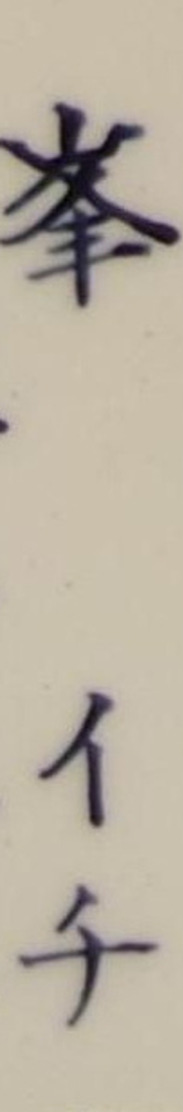峯イチ
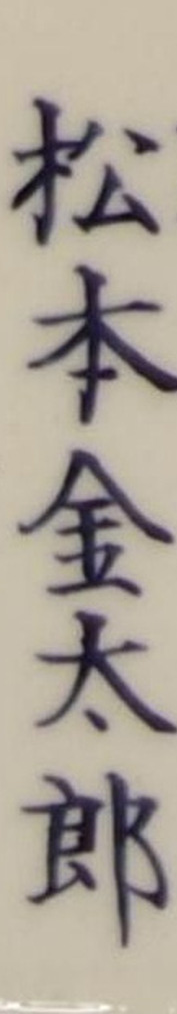松本金太郎
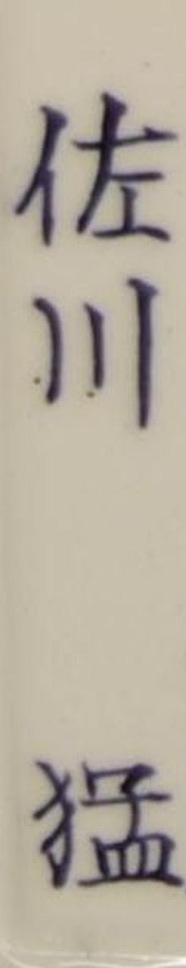佐川猛
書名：E~L
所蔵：高野山金剛峯寺
